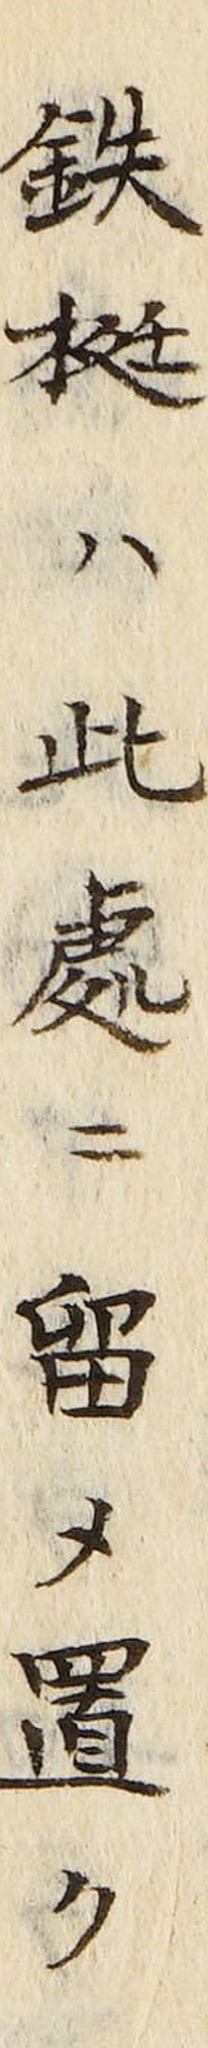鉄梃ハ此処ニ留メ置ク
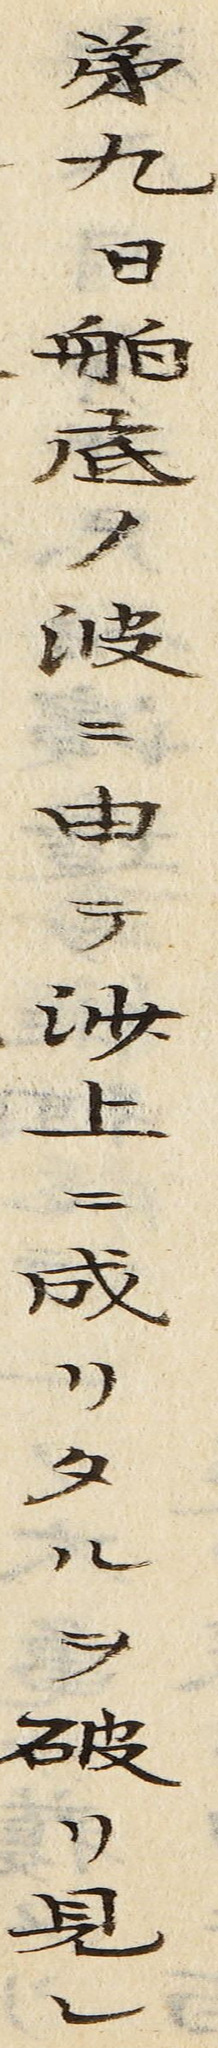第九日舶底ノ波ニ由テ沙上ニ成リタルヲリ破リ見レ
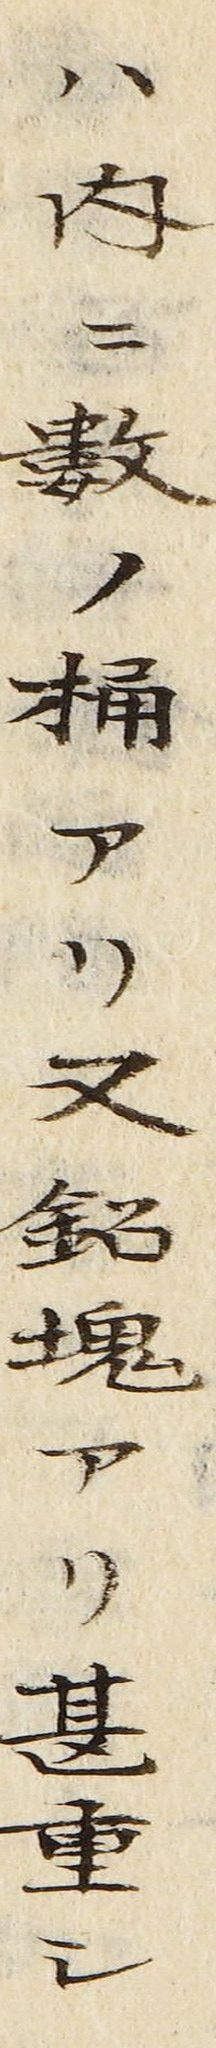ハ内ニ数ノ桶アリ又鉛塊アリ甚重シ
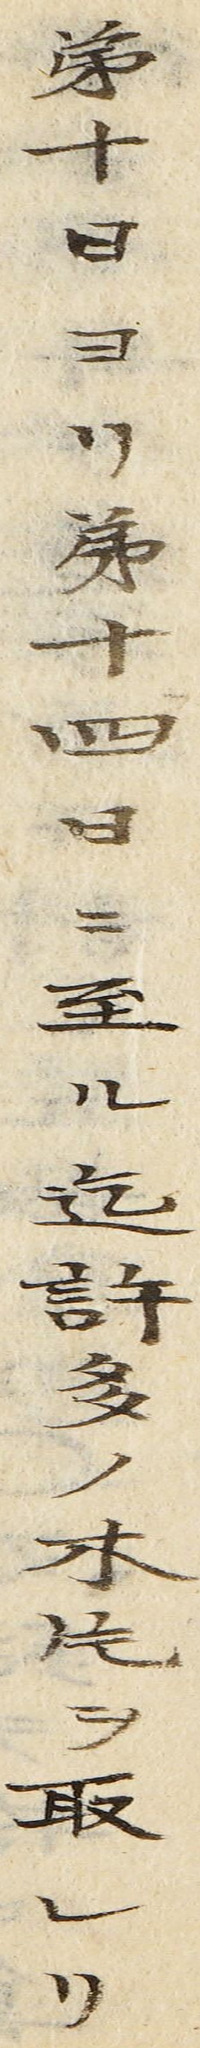第十日ヨリ第十四日ニ至ル迄許多ノ木片ヲ取レリ
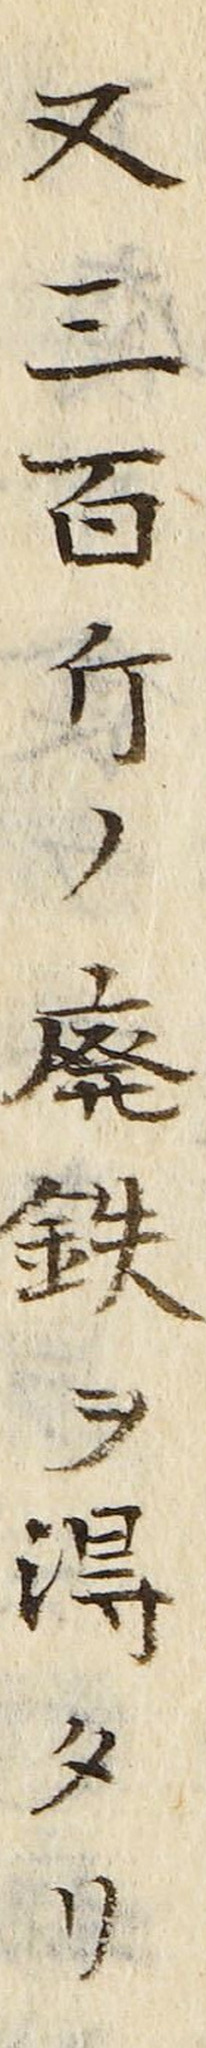又三百斤ノ廃鉄ヲ得タリ
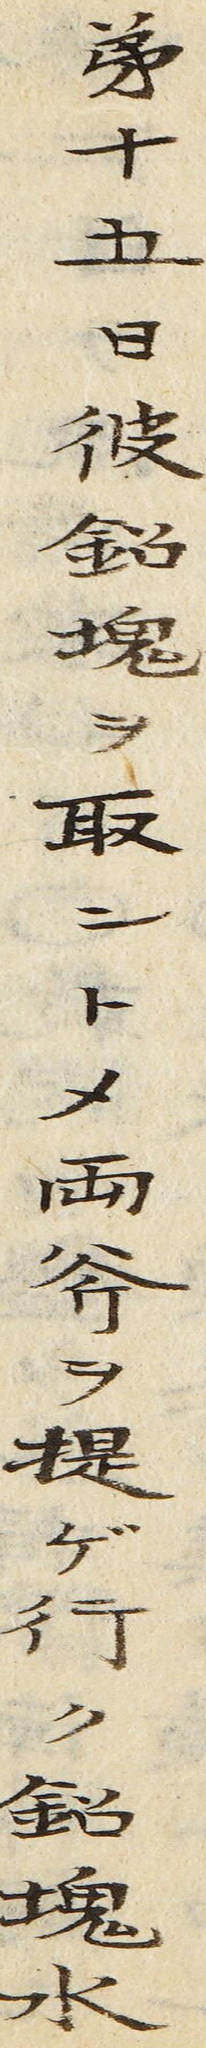第十五日彼鉛塊ヲ取ントシテ両斧ヲ提ゲ行ク鉛塊水
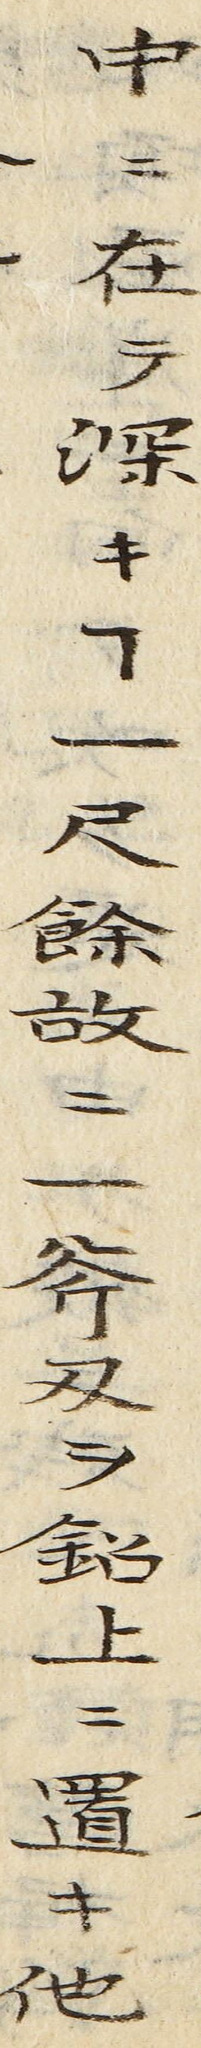中ニ在テ深キコト一尺余故ニ一斧刃ヲ鉛上ニ置キ他
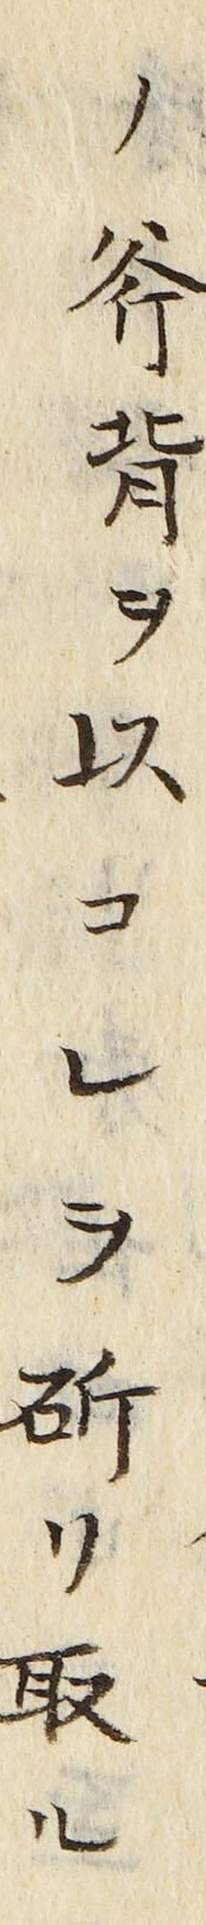ノ斧背ヲ以コレヲ斫リ取ル
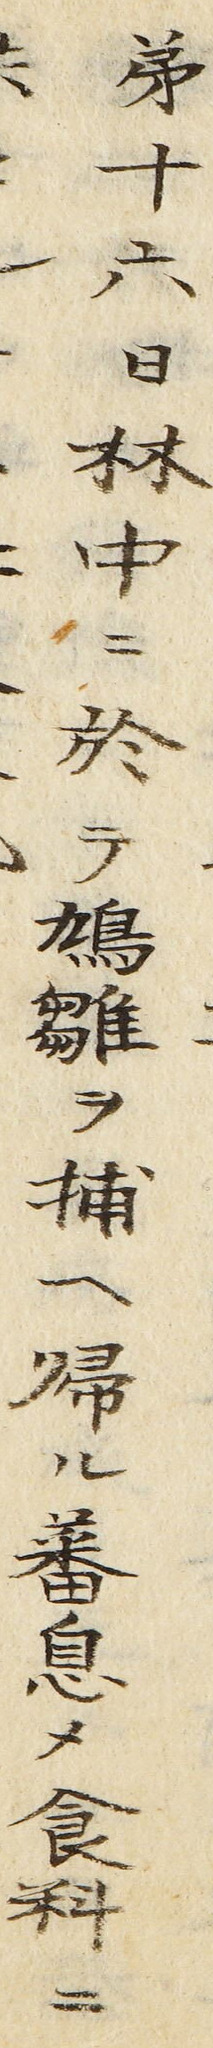第十六日林中ニ於テ鳩雛ヲ捕ヘ帰ル蕃息シテ食料ニ
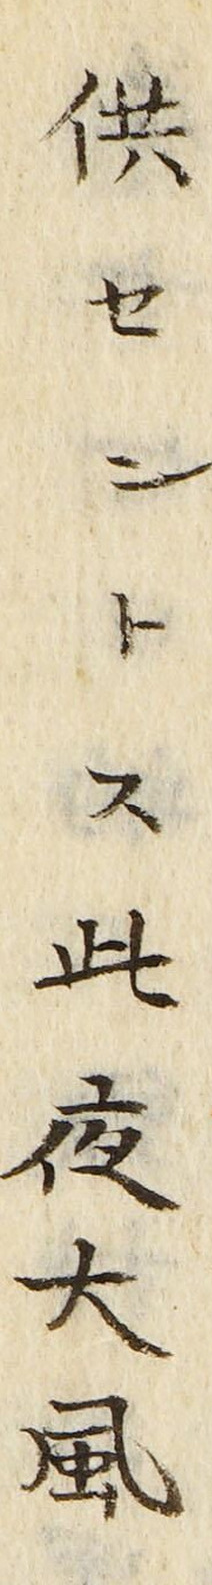供セントス此夜大風

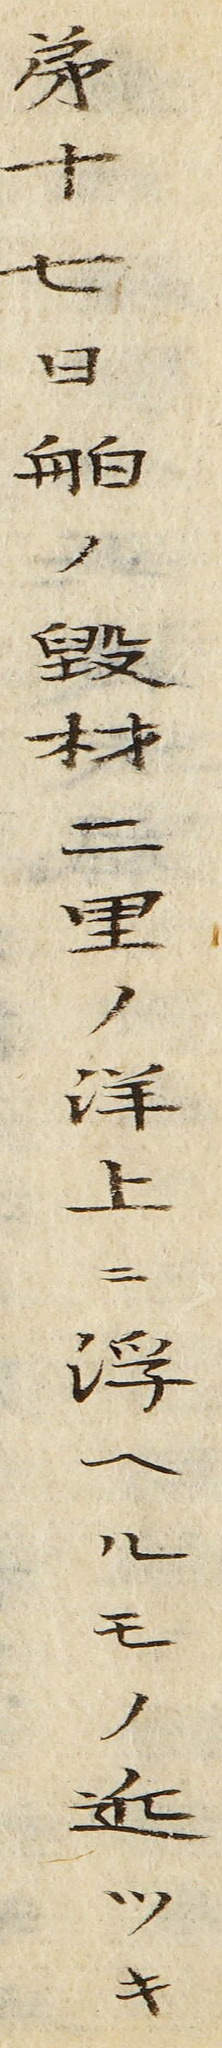第十七日舶ノ毀材二里ノ洋上ニ浮ヘルモノ近ツキ
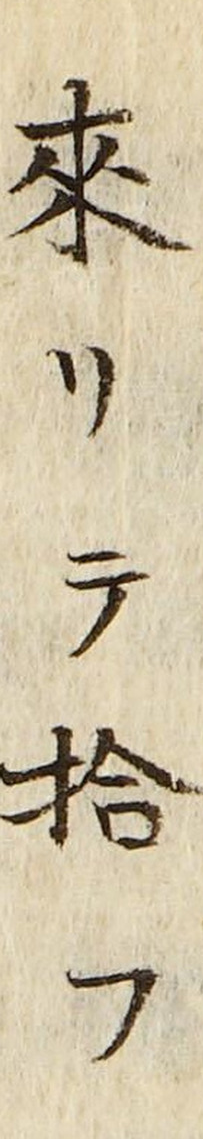来リテ拾フ
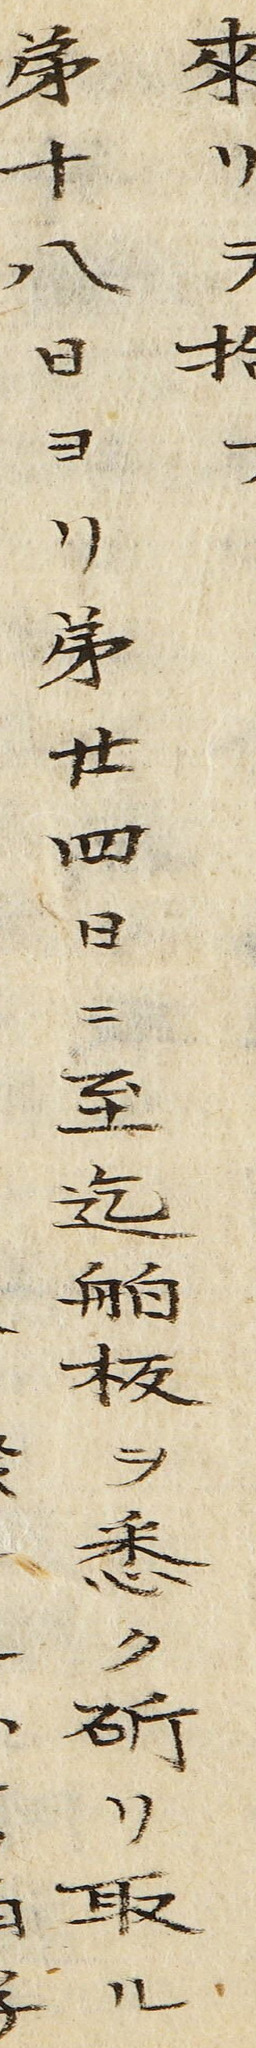第十八日ヨリ第廿四日ニ至迄舶板ヲ悉ク斫リ取ル
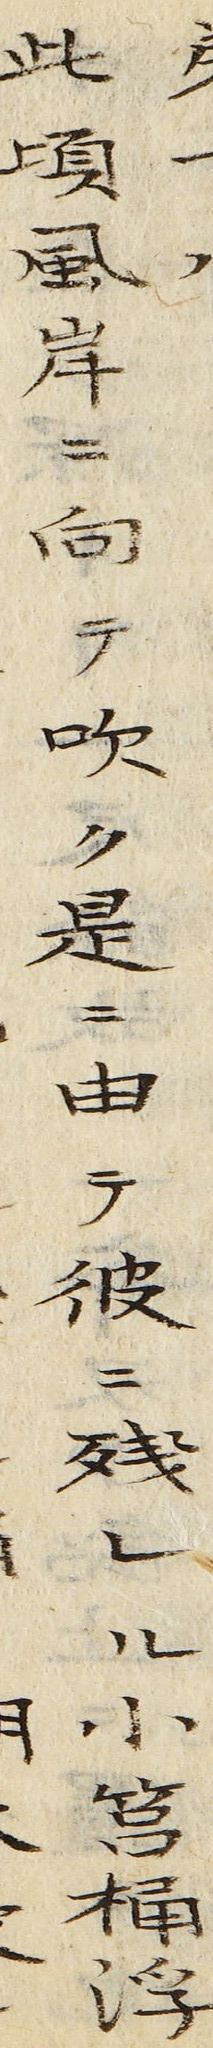此頃風岸ニ向テ吹ク是ニ由テ彼ニ残レル小筥桶浮
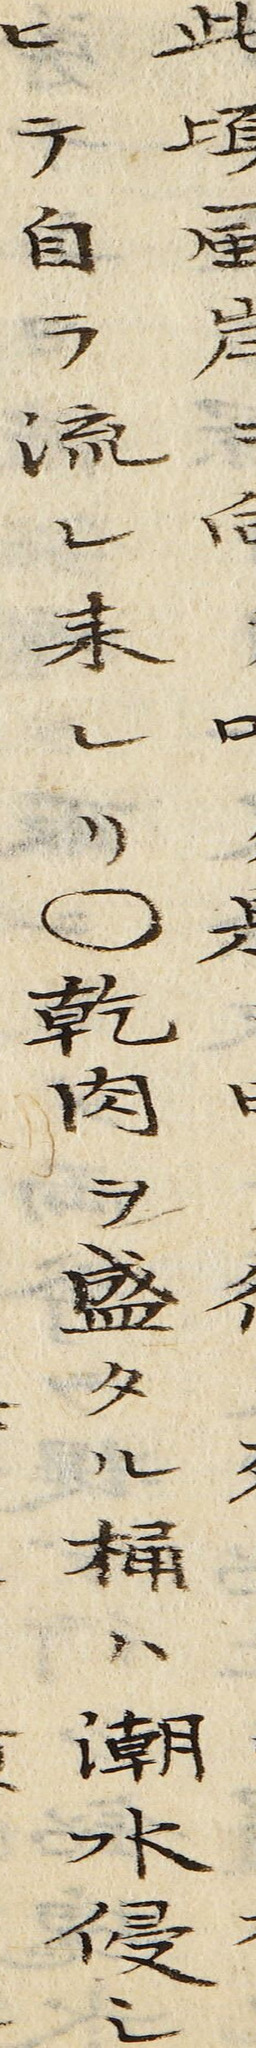ヒテ自ラ流レ来レリ◯乾肉ヲ盛タル桶ハ潮水侵シ
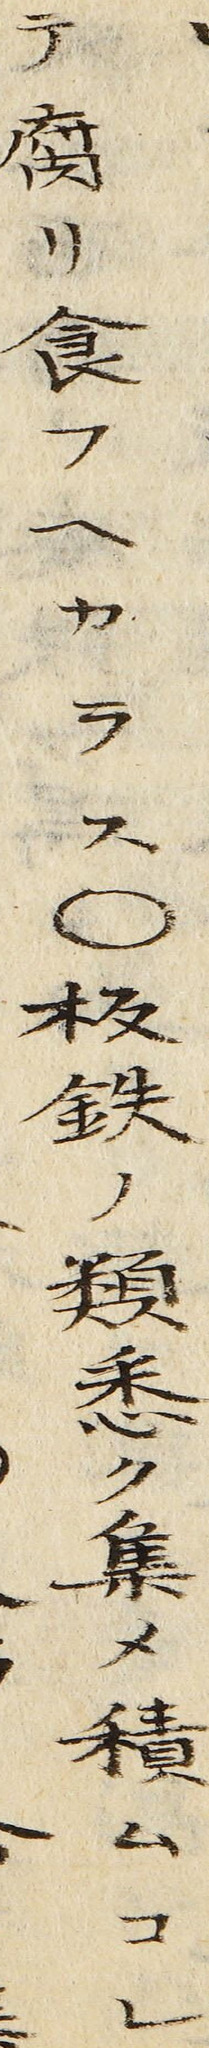テ腐リ食フヘカラス◯板鉄ノ類悉ク集メ積ムコレ
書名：漂流紀事
